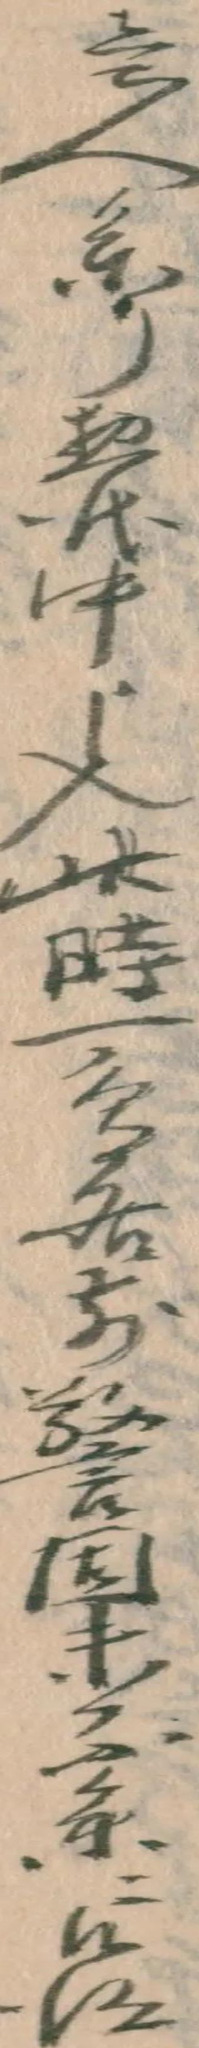壱人参り惣代中申入此時一鳥居前警固未不参ニ候得
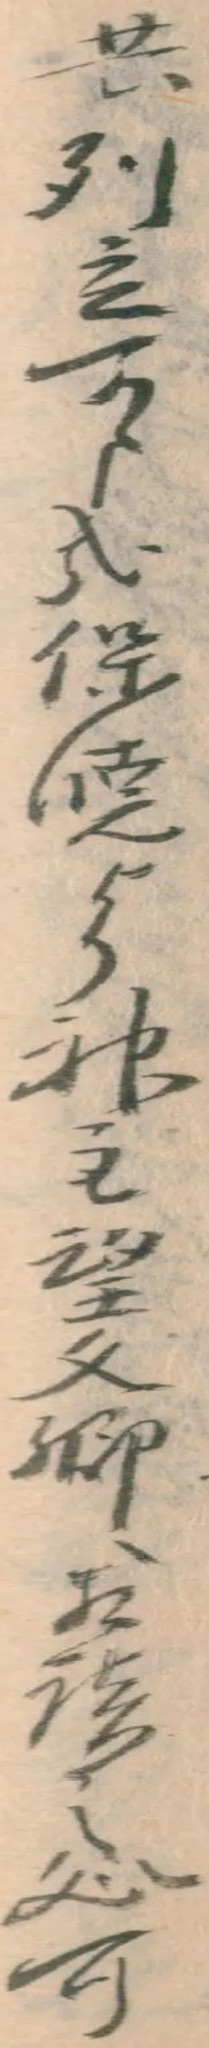共列立可申哉保暁より神主望久卿へ相談之処可
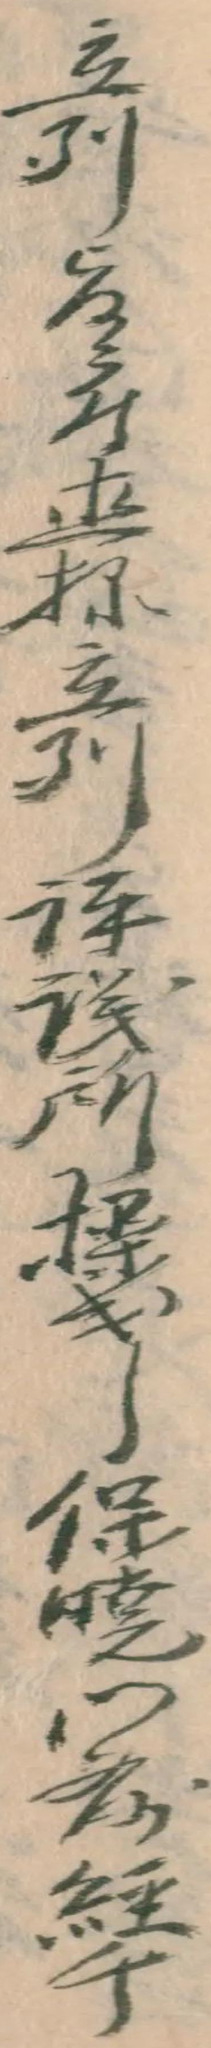立列旨ニ付直様立列評議所操出し保暁門前経千
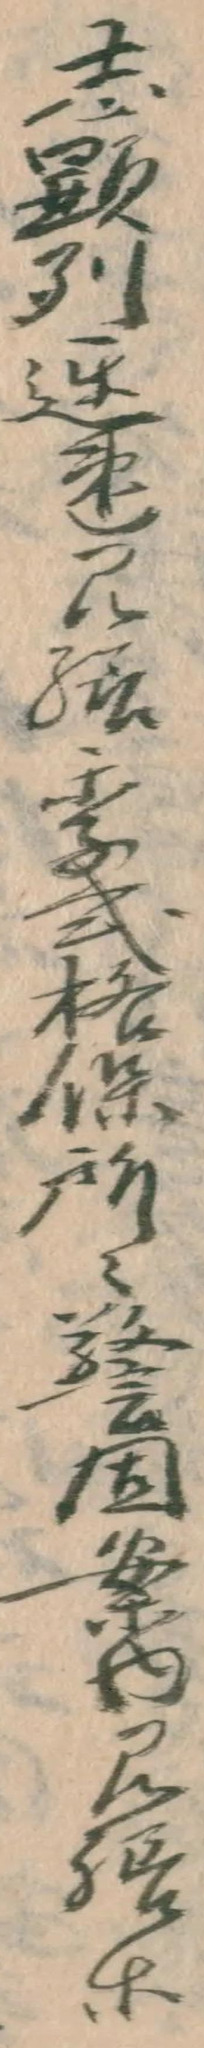志顕列遅速見繕季式格保所々警固案内見繕等
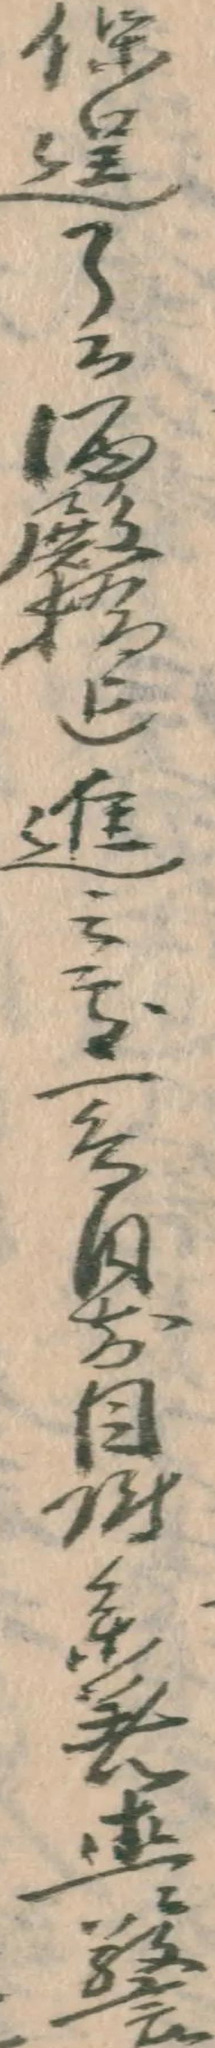保逞了而酒殿橋迄進之處一鳥自前目附参着直ニ警
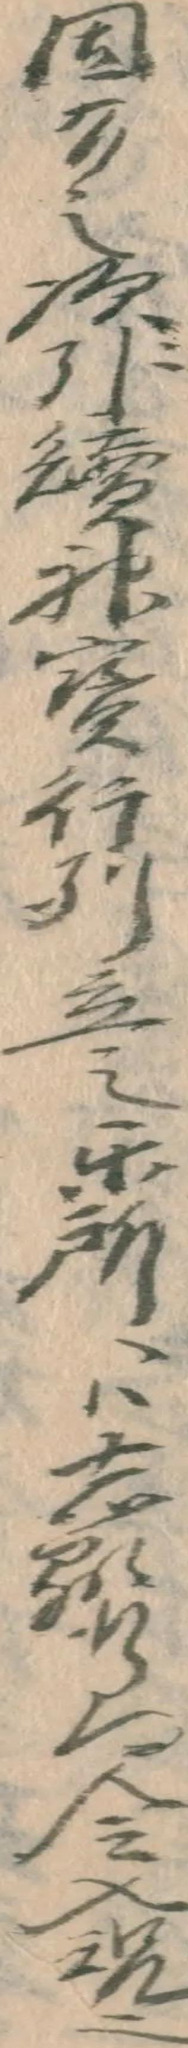固有之次ニ引續神寶行列立之楽所ヘハ志顕行向令入魂也
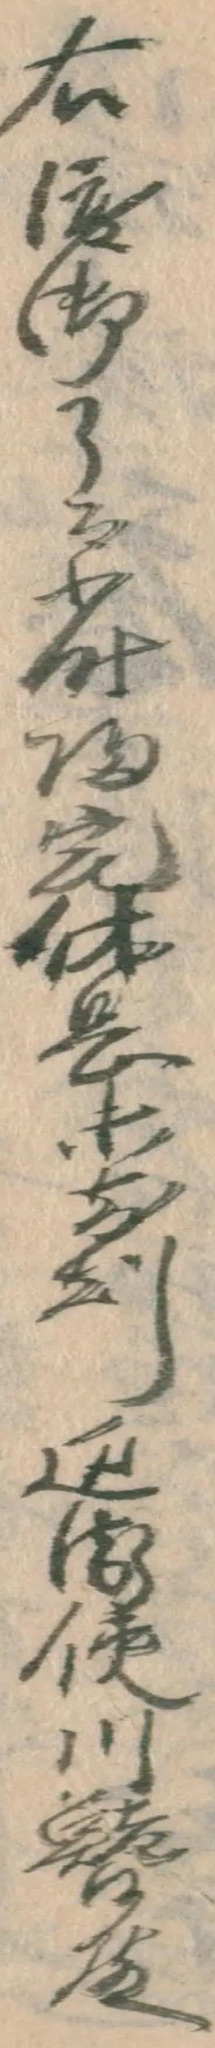右渡御了而少時帰宅休息等前刻近衛使川鰭殿
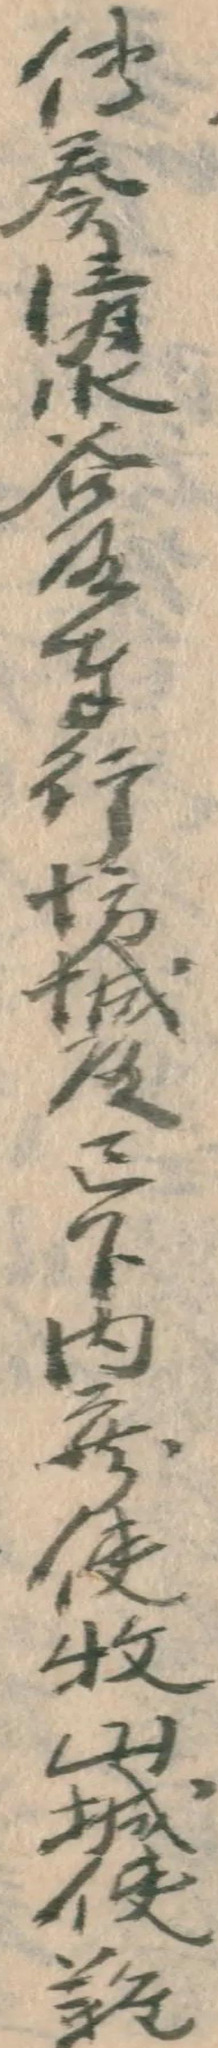傳奏清水谷殿奉行坊城殿已下内蔵使牧山城使難
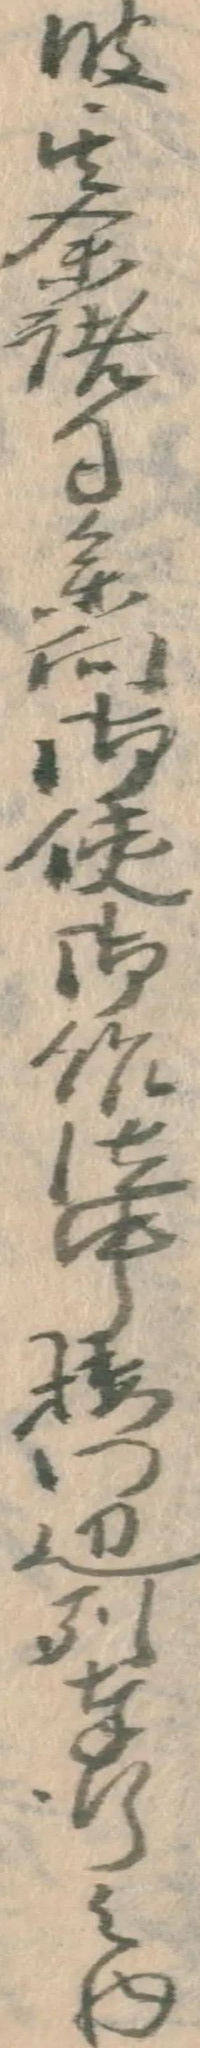波其余諸司参向御使御作法中桜門辺列奉行之内
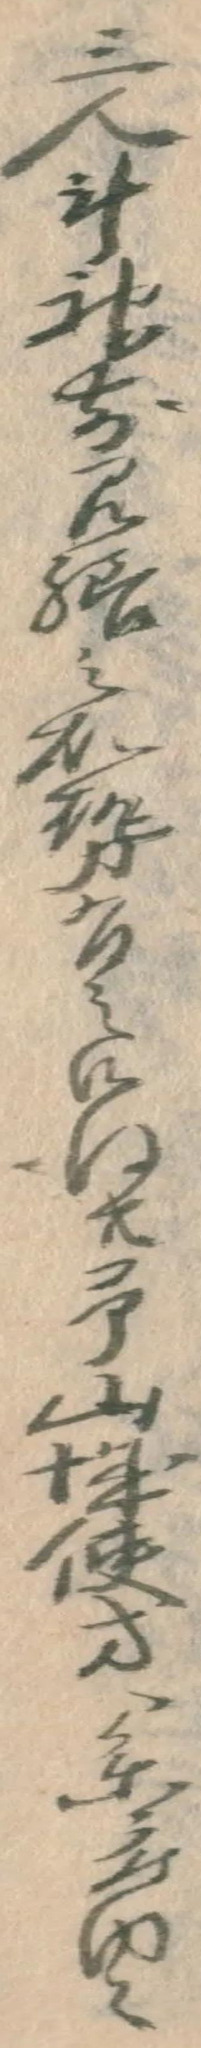三人斗神前見膳之加勢有之候得共予山城使方へ参ニ付内々
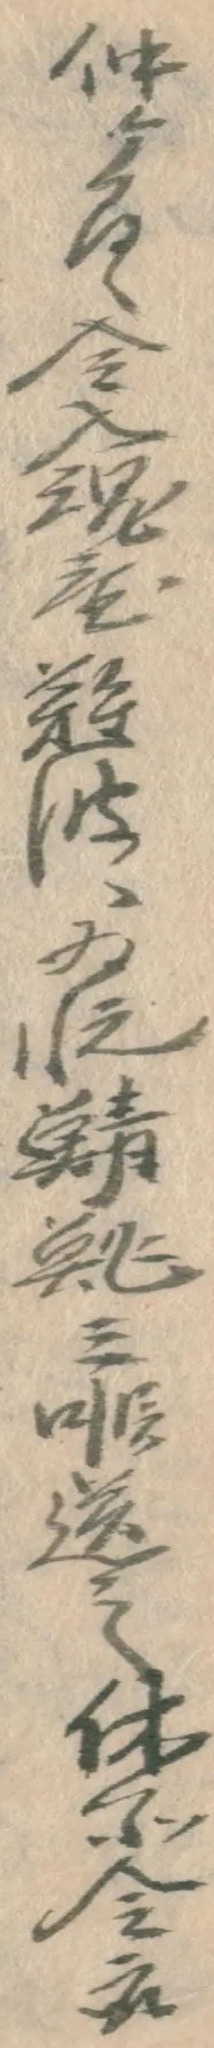仲ケ間へ令入魂置難波へ為祝鯖三暇送之休所令取
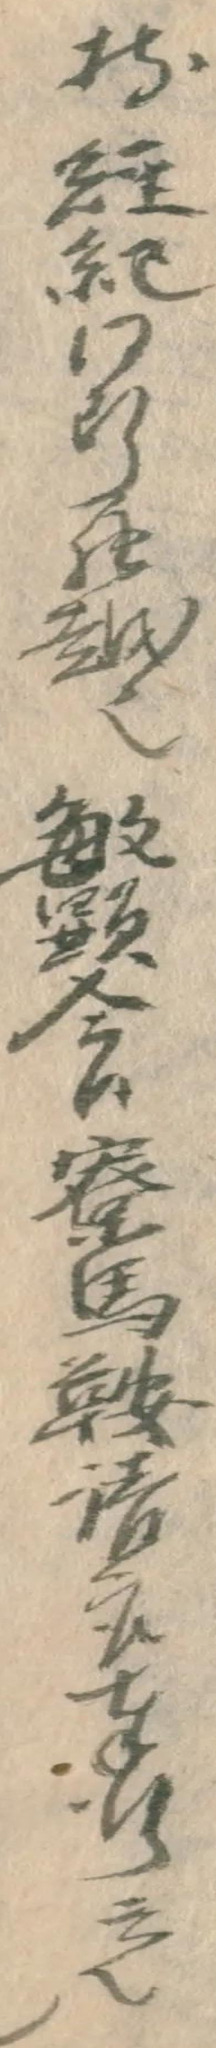持経紀同断罷越也敏顕今日寮馬鞍請取奉行云々
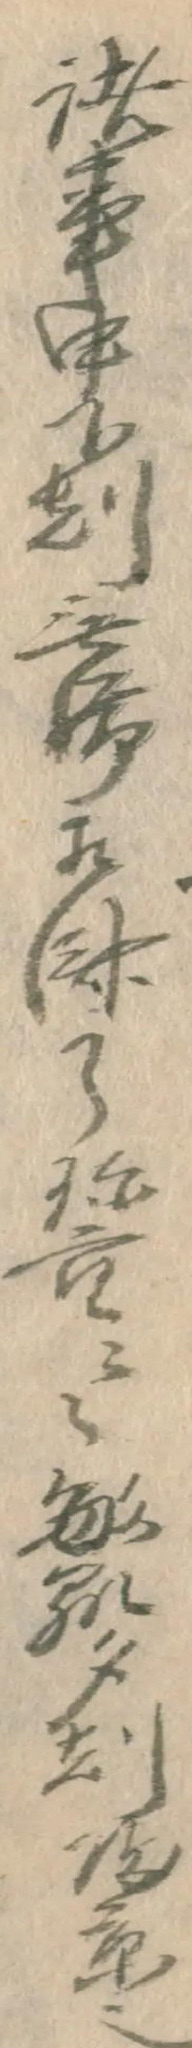諸事申下刻無滞相済了弥重々々敏顕夕刻帰京也
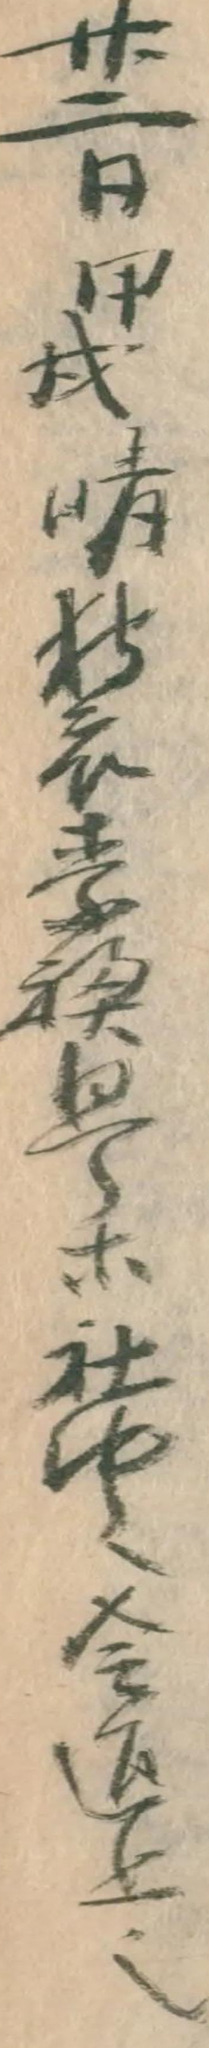廿二日甲戌晴狩衣素襖白丁等社中へ令返上也

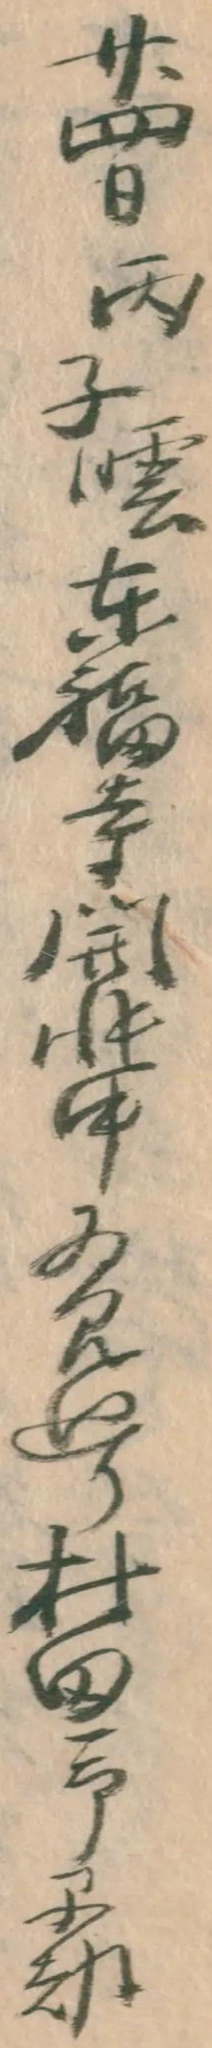廿四日丙子晴東福寺開帳中為見廻り村田予早朝
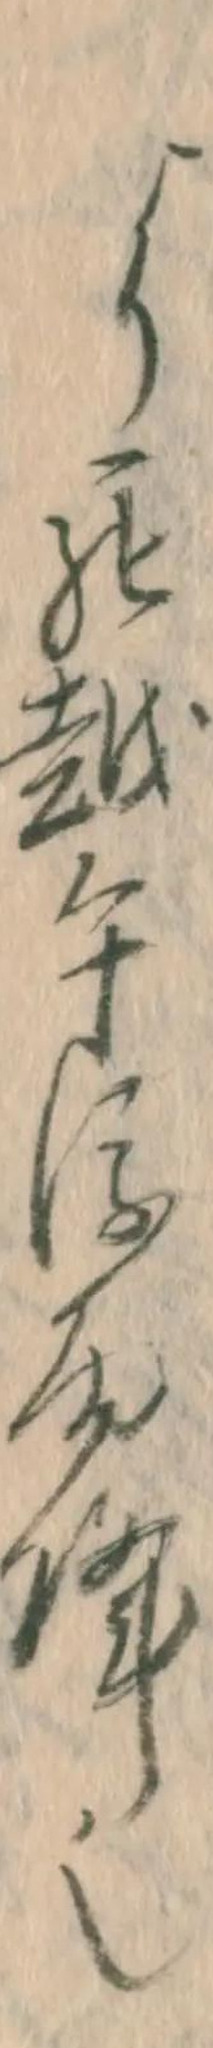より罷越午後降也
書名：賀茂社記録. 第67冊
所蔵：国立国会図書館 National Diet Library, JAPAN
